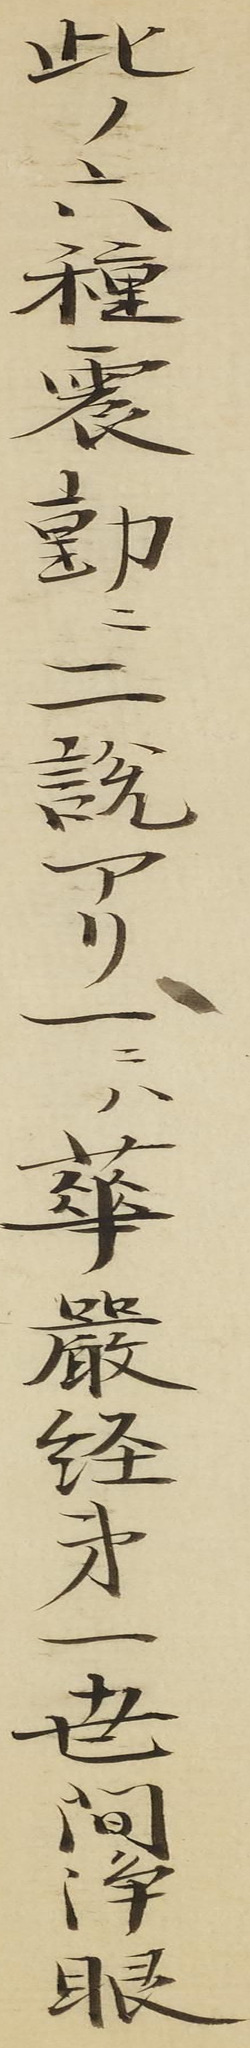此ノ六種震動ニニ説アリ一ニハ華厳経第一世間浄眼
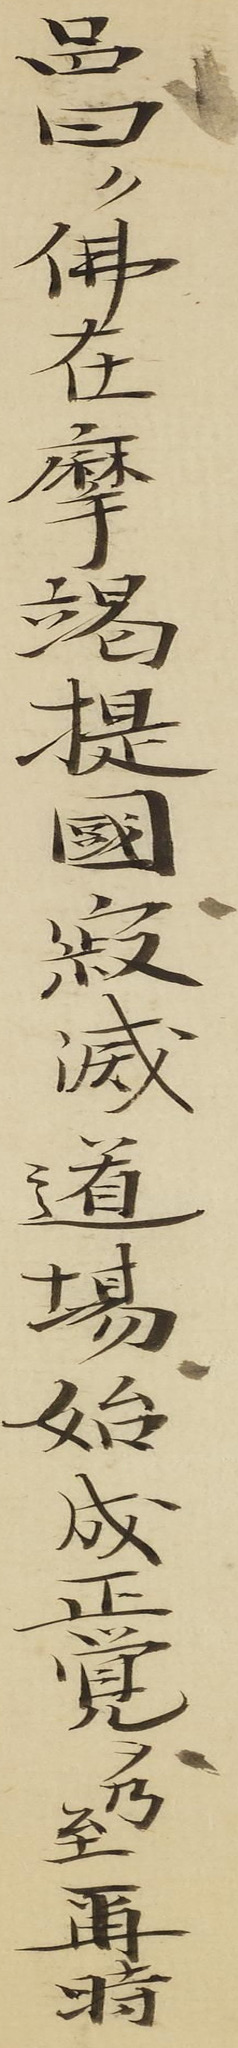品曰ク仏在摩竭提国寂滅道場始成正覚ヲ乃至再時
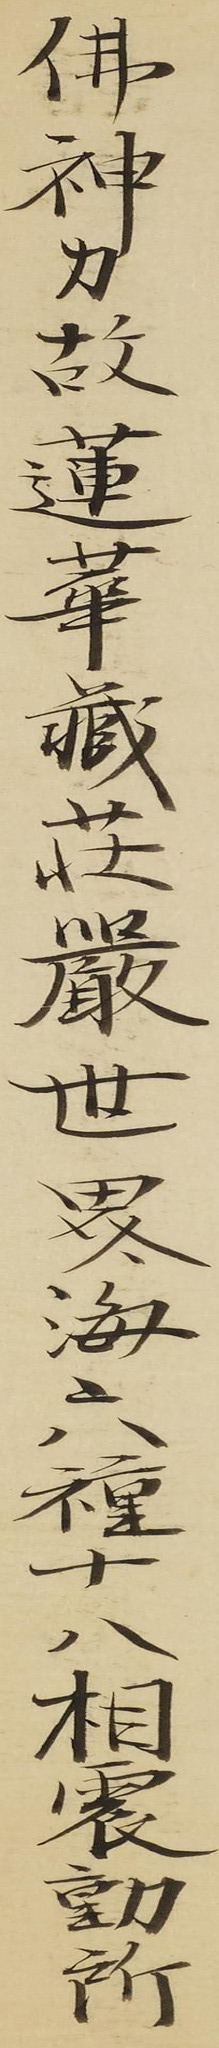仏神力故蓮華蔵荘厳世界海六種十八相震動所
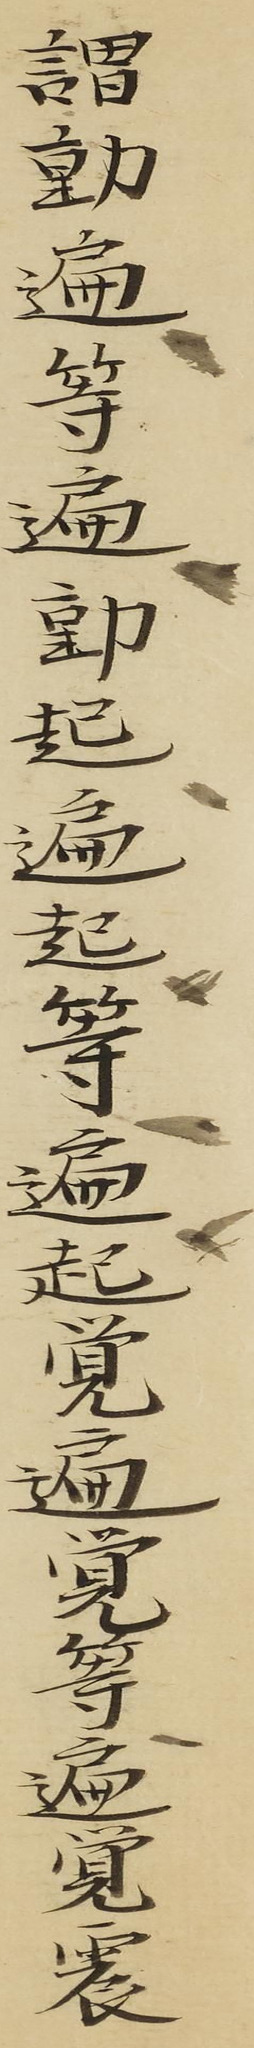謂動遍等遍動起遍起等遍起覚遍覚等遍覚震
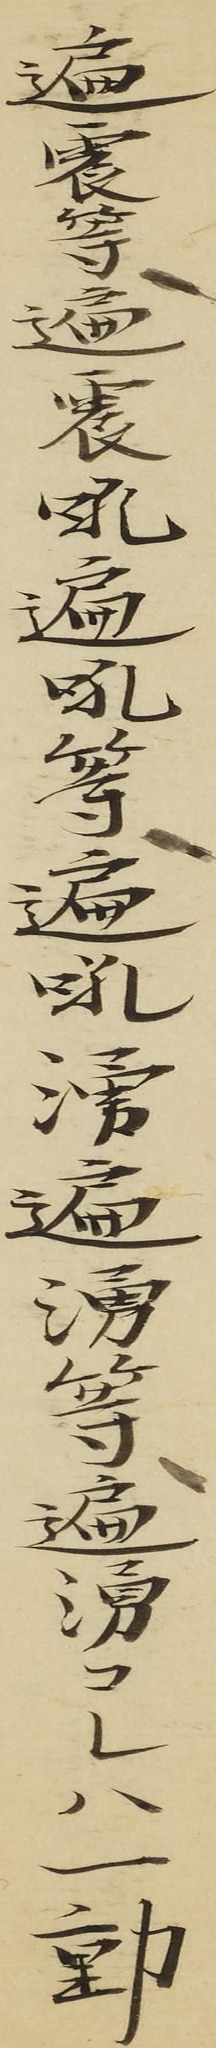遍震等遍震吼遍吼等遍吼湧遍湧等遍湧コレハ一動
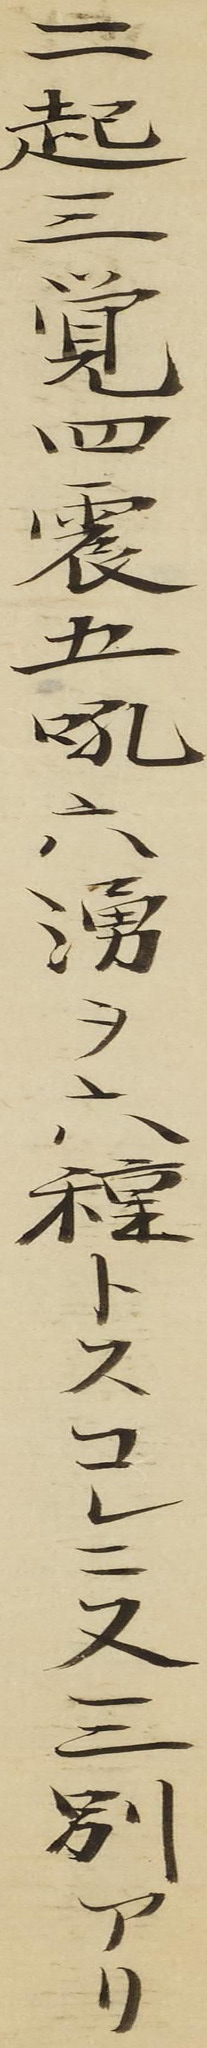ニ起三覚四震五吼六湧ヲ六種トスコレニ又三別アリ
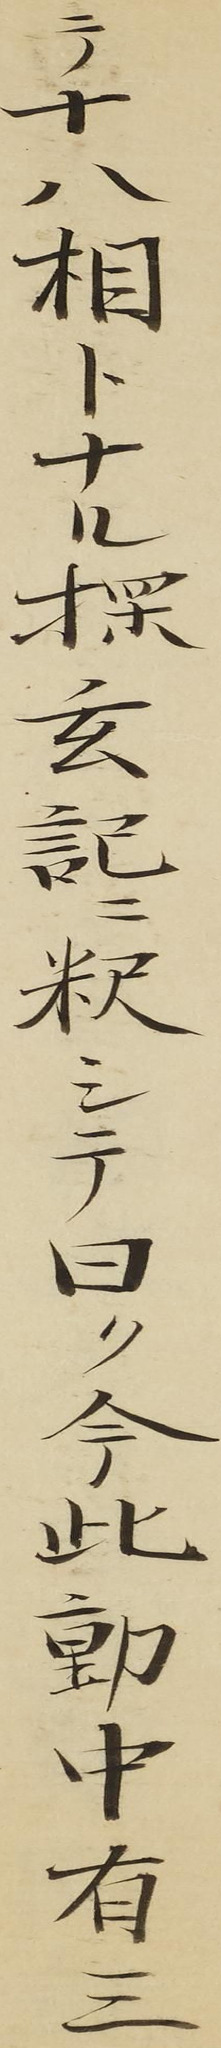テ十八相トナル探玄記ニ釈シテ曰ク今此動中有三
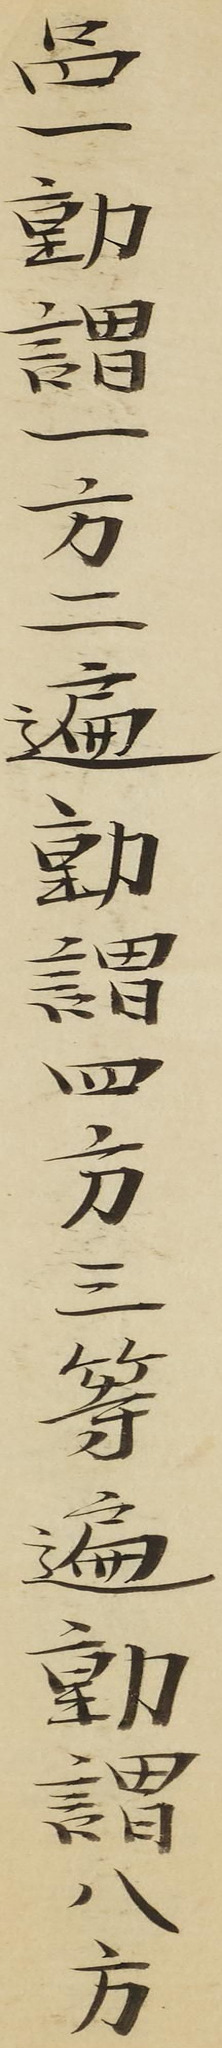品一動謂一方ニ遍動謂四方三等遍動謂八方
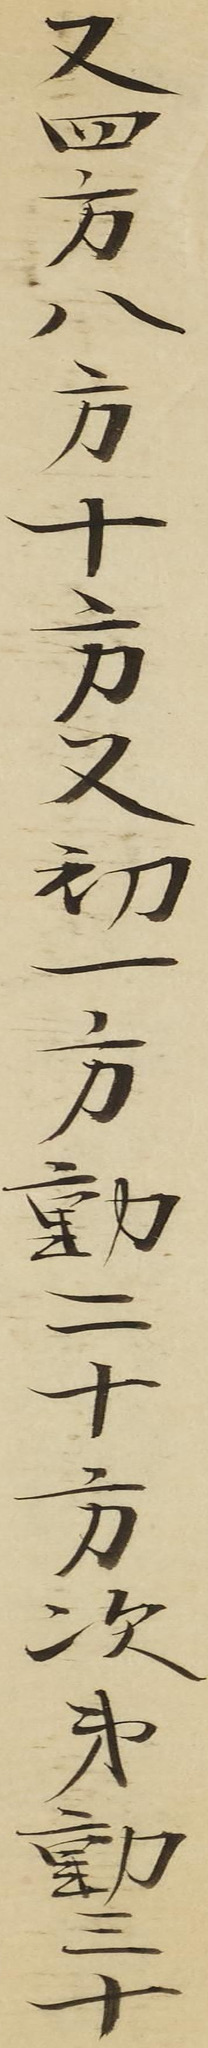又四方八方十方又初一方動二十方次第動三十
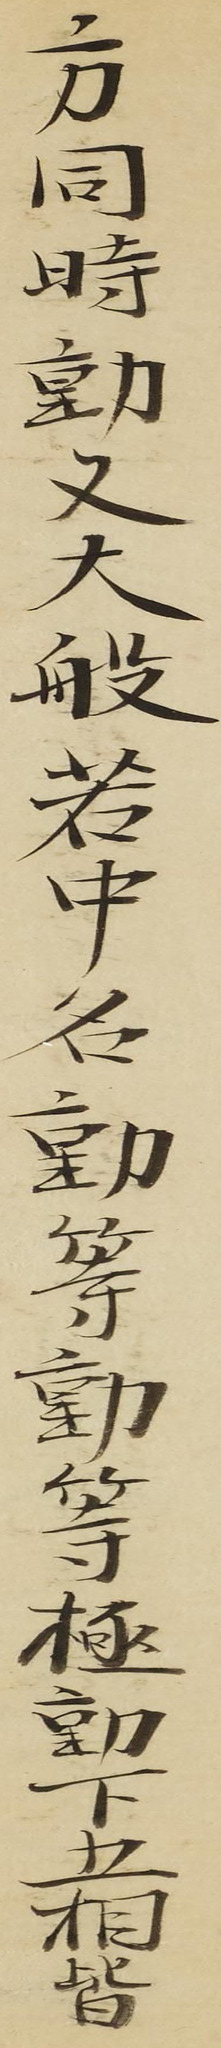方同時動又大般若中名動等動等極動下五相皆
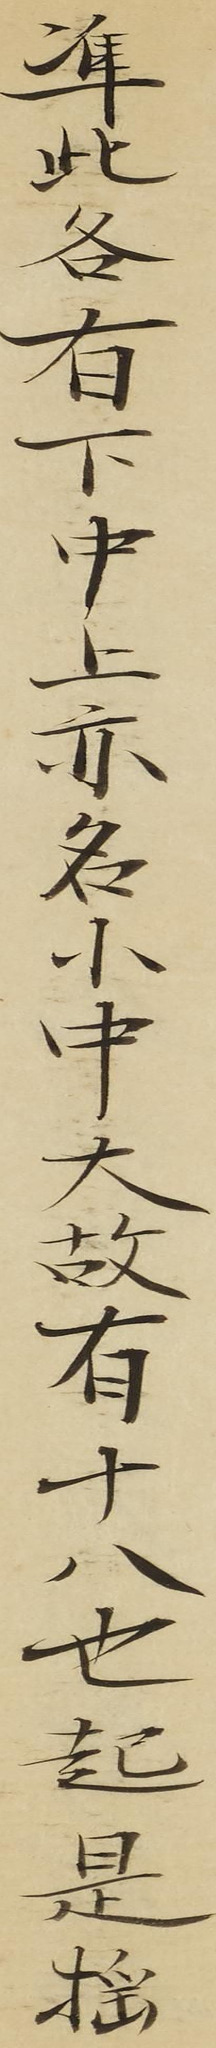準此各有下中上亦名小中大故有十八也起是揺
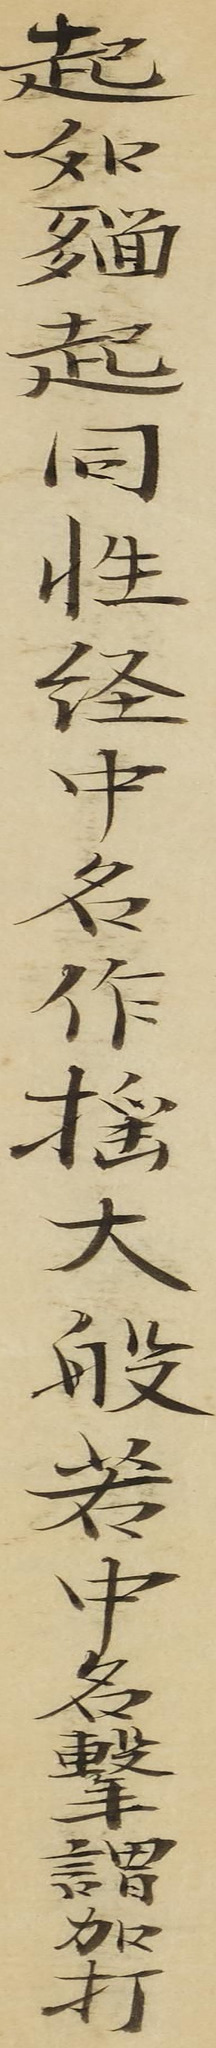起如麺起同性経中名作揺大般若中名撃謂加打
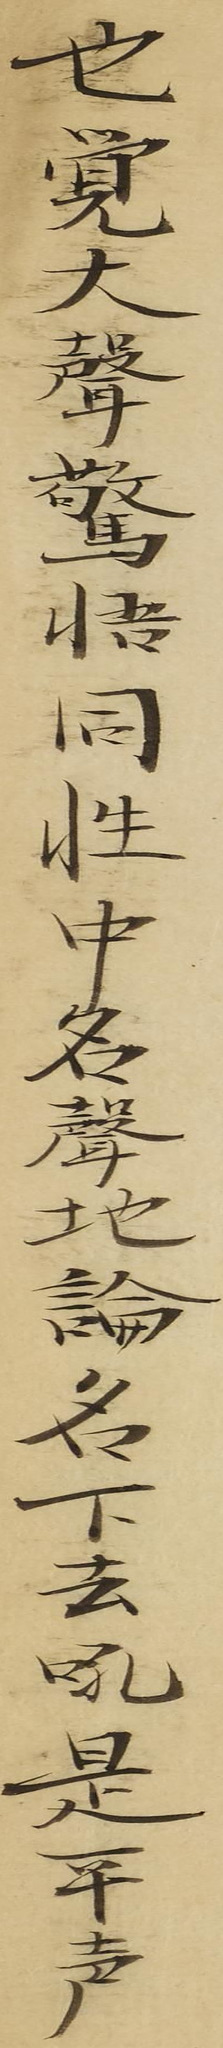也覚大声驚悟同性中名声地論名下去吼是平声

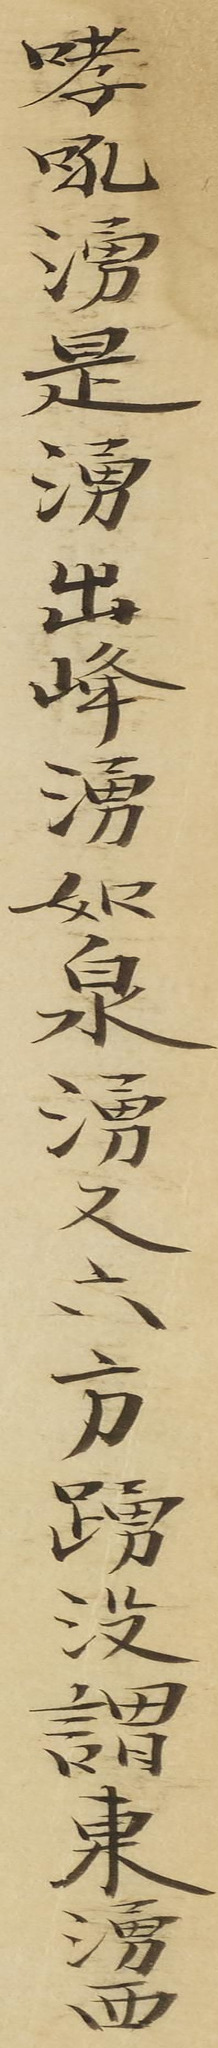哮吼湧是湧出峰湧如泉湧又六方踴没謂東湧西
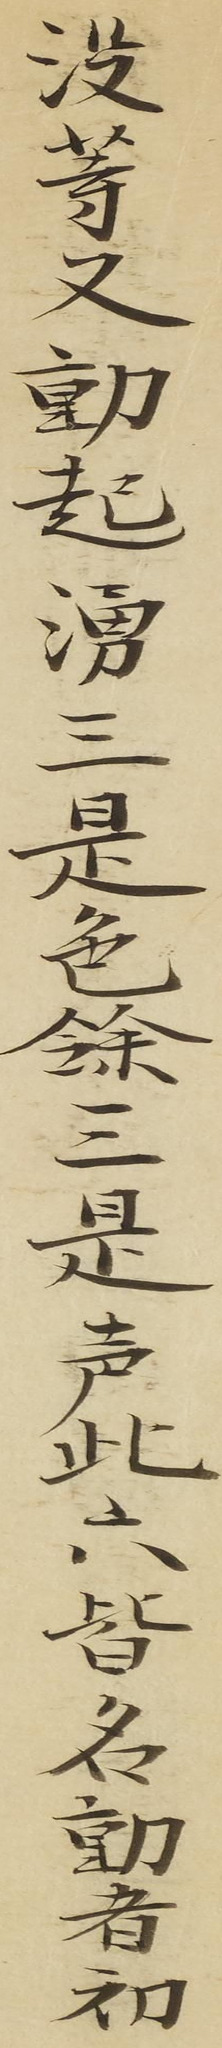没等又動起湧三是色余三是声此六皆名動者初
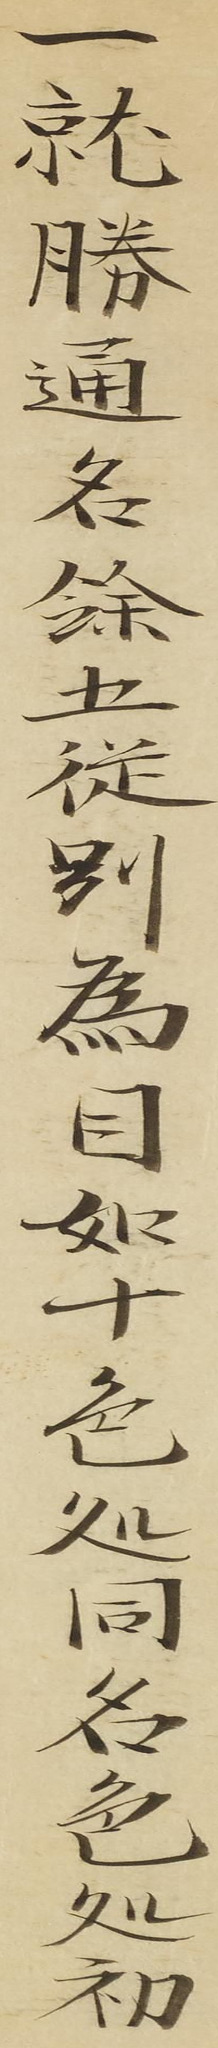一就勝通名余五従別為目如十色処同名色処初
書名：地震説　鶴高山善仁寺天柗老人著述　全
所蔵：東京大学地震研究所図書室 Earthquake Research Institute Library, The University of Tokyo, JAPAN
